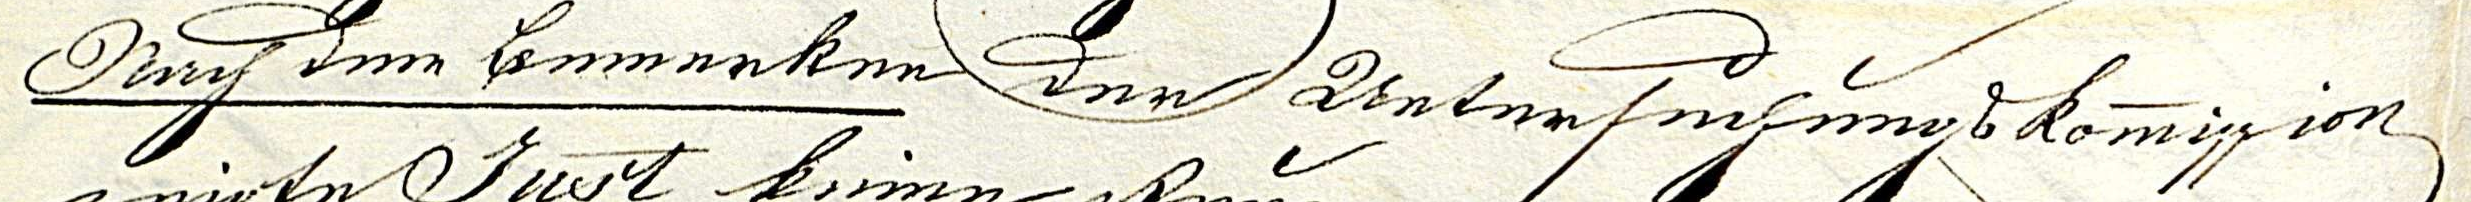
Nach dem Bemerken der Untersuchungskommission
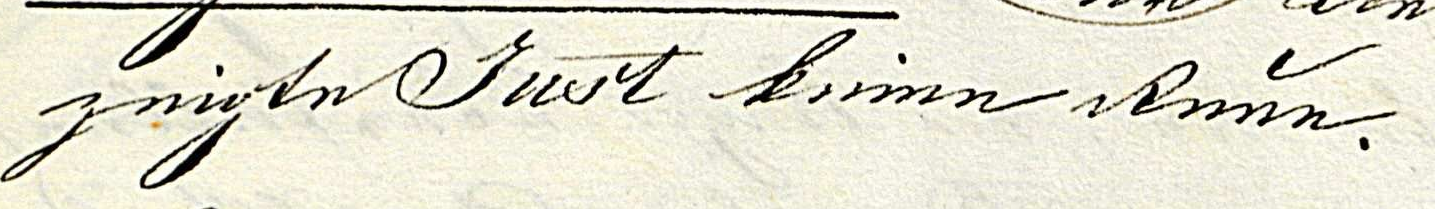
zeigte Just keine Reue.
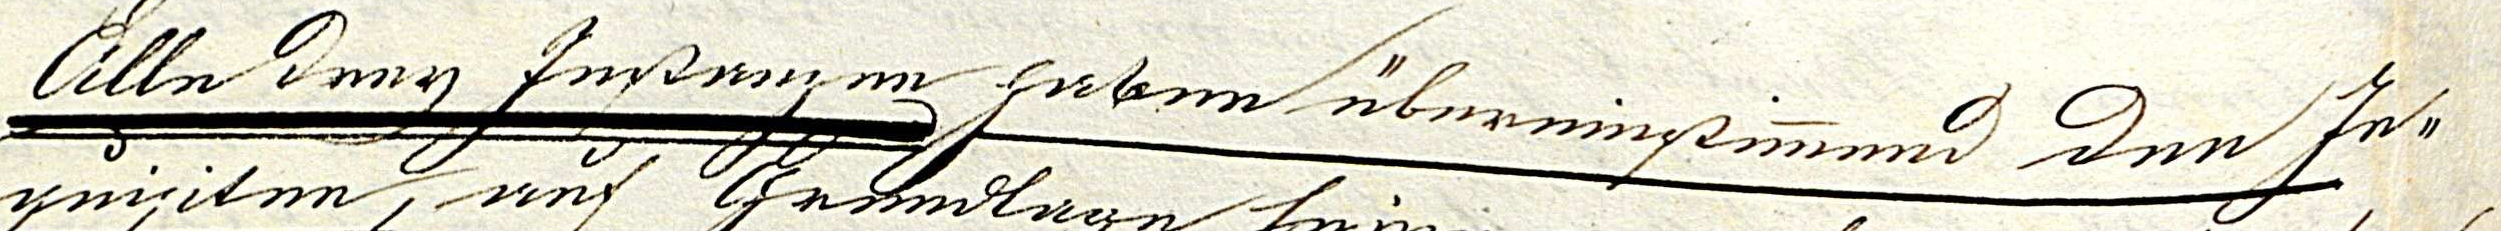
Alle drey Instanzen gaben übereinstimmend den In¬
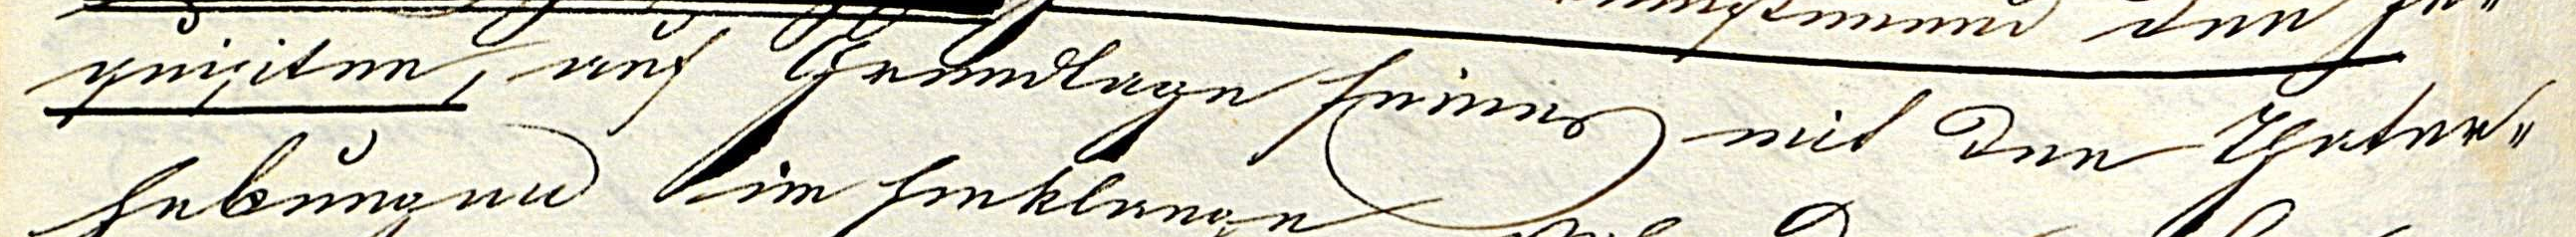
quisiten, auf Grundlage seines mit den Thater¬
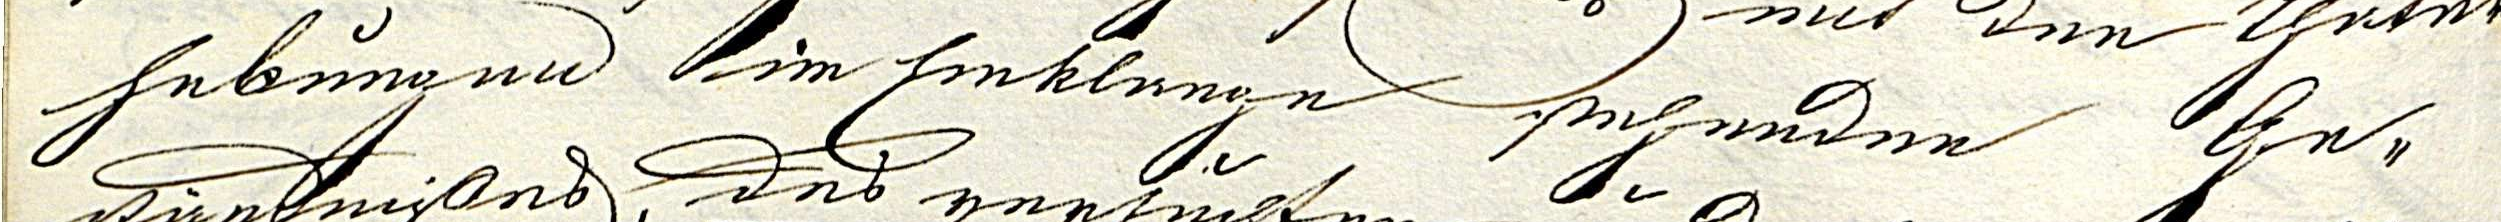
hebungen im Einklange stehenden Ge¬
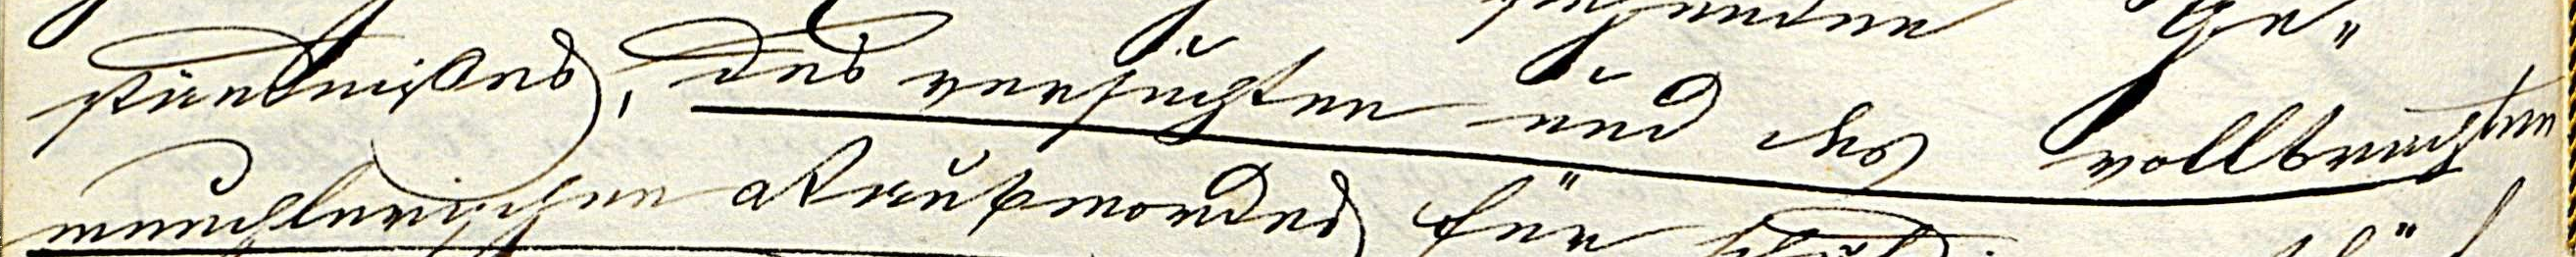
ständnißes, des versuchten und des vollbrachten
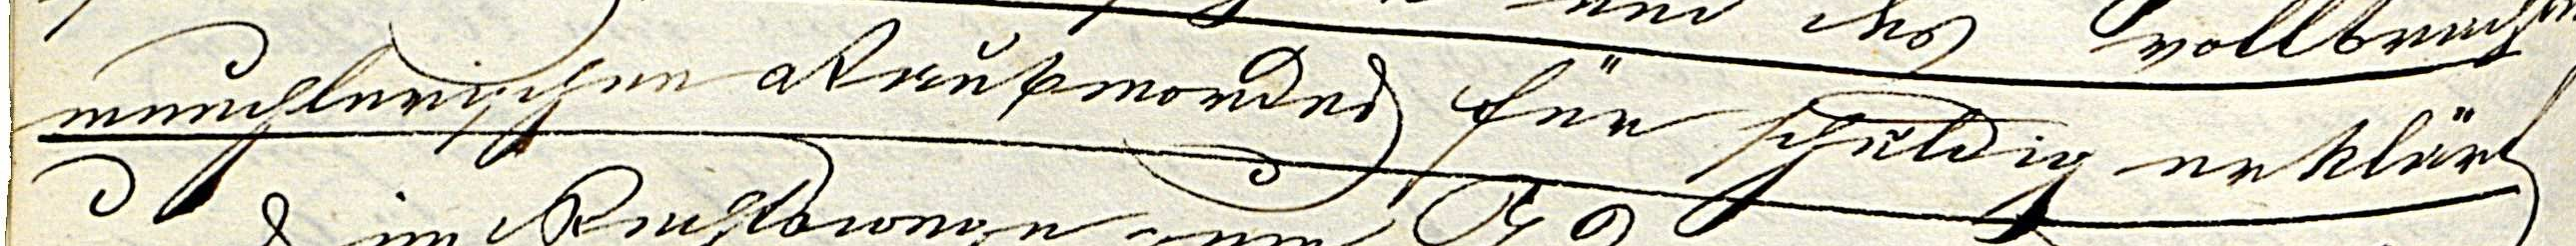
meuchlerischen Raubmordes für schuldig erklärt
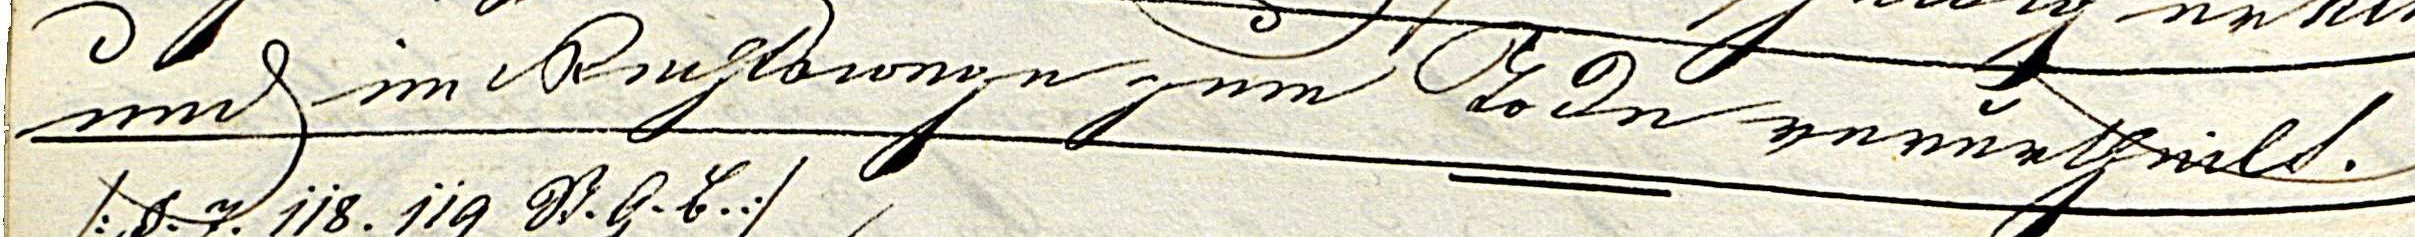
und im Rechtswege zum Tode verurtheilt.
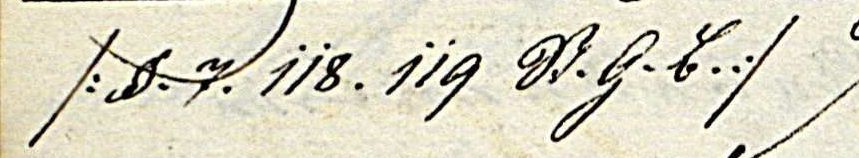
(§7.118.119 St G B)
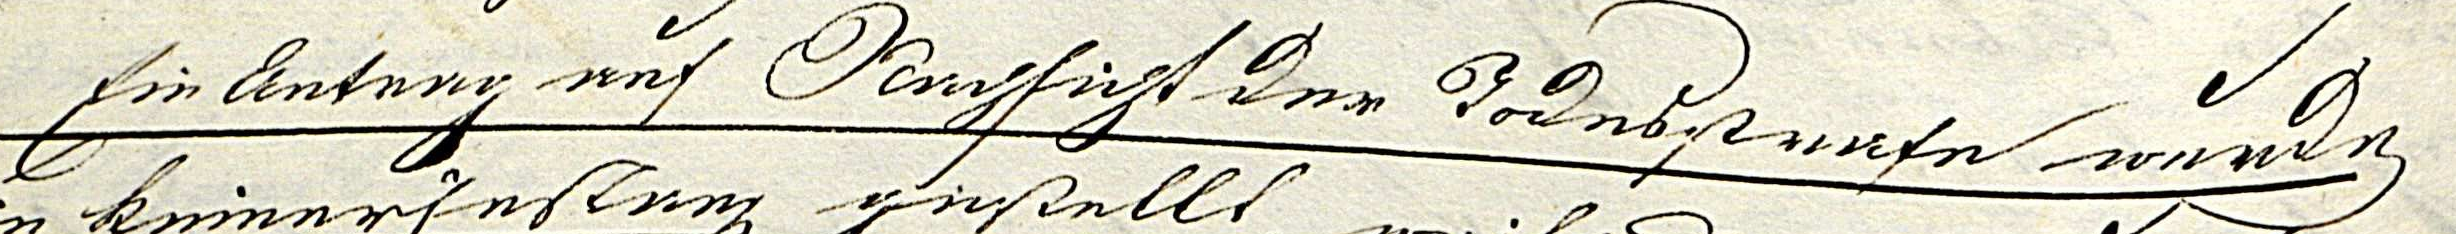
Die Antrag auf Nachsicht der Todesstrafe wurde
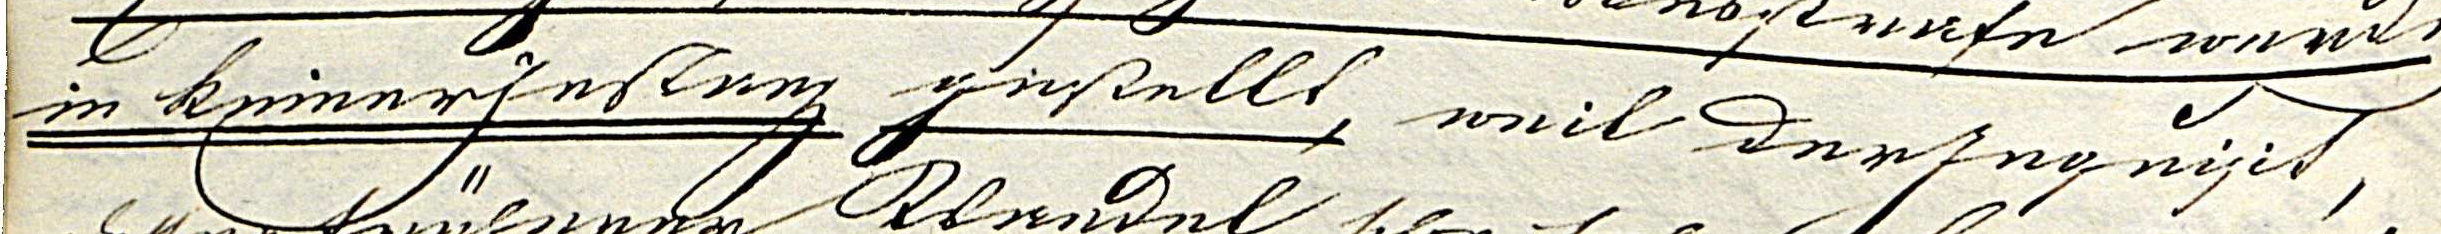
in keiner Instanz gestellt, weil der Inquisit,
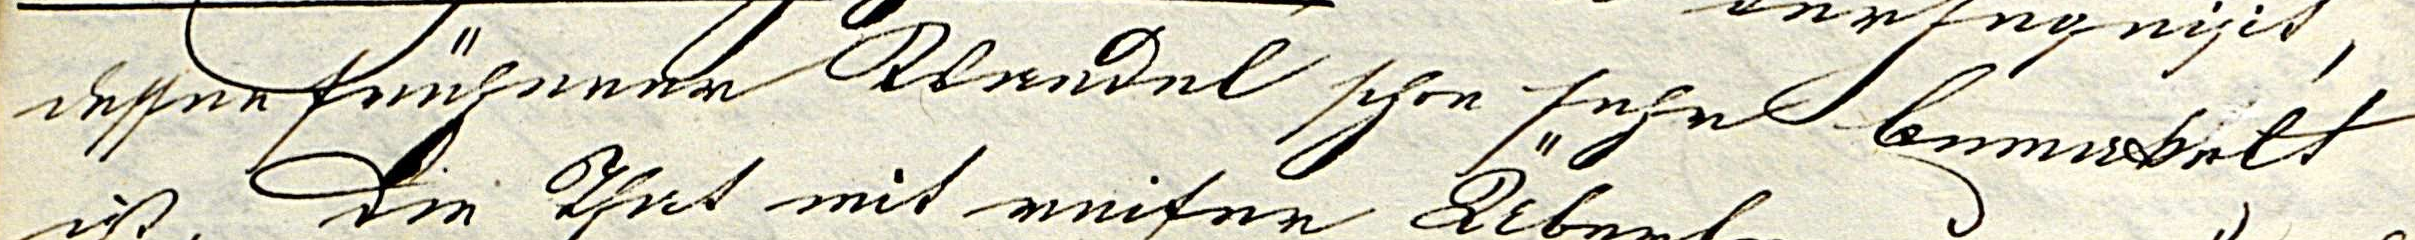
dessen früheren Wandel schon sehr bemakelt
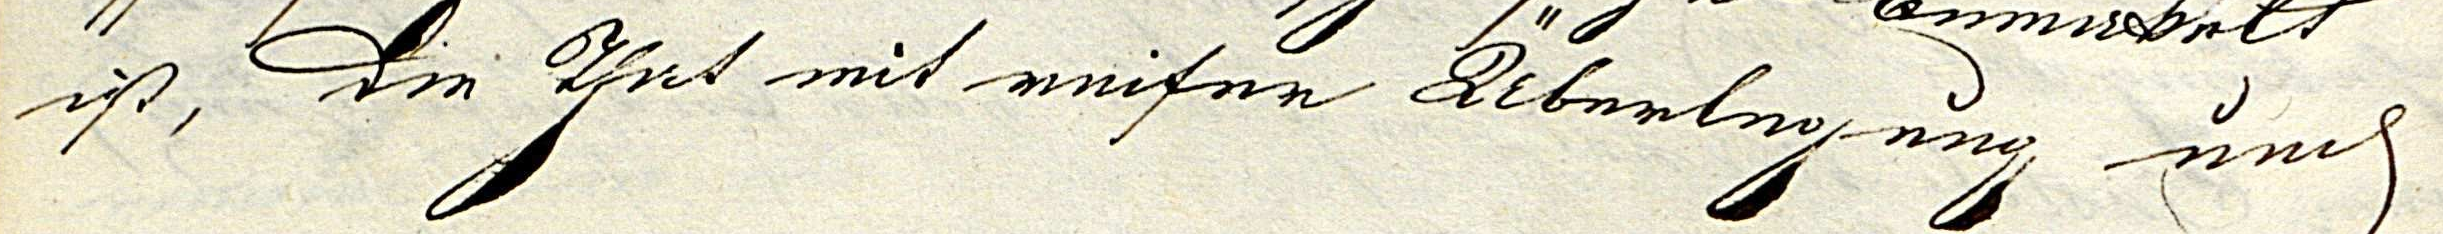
ist, die That mit reifen Überlegung auch
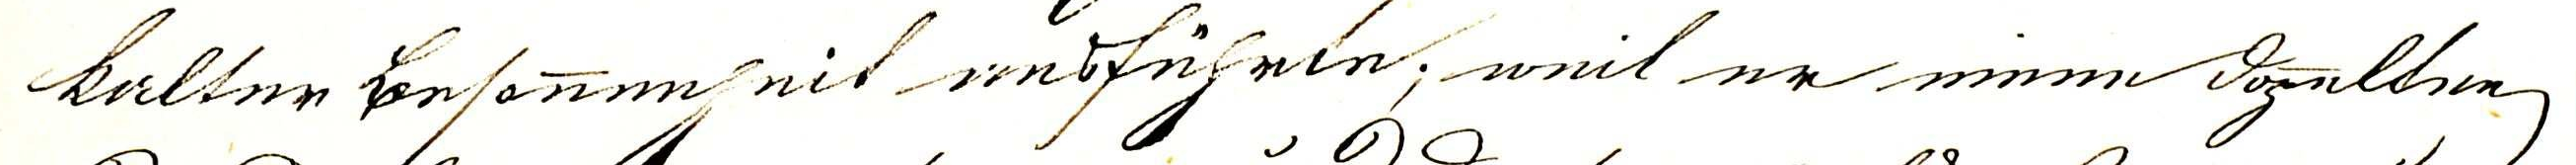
kalten Besonnenheit ausführte, weil er einen doppelten
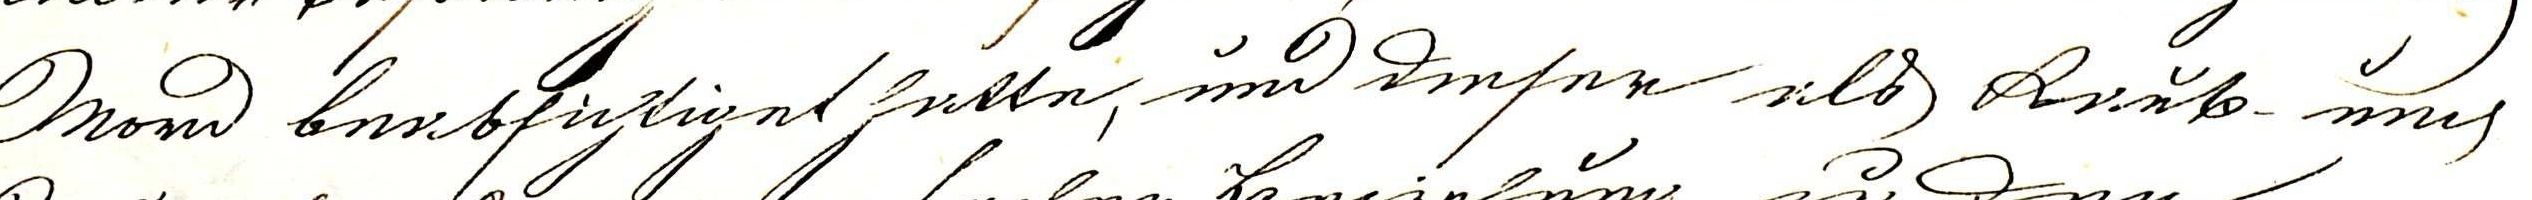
Mord beabsichtiget hatte, und dieser als Raub- und
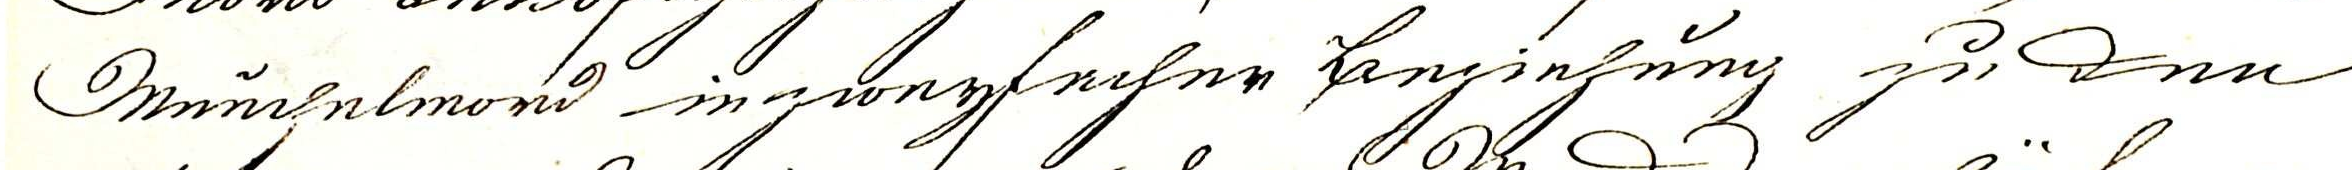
Meuchelmord in zweyfacher Beziehung zu den
